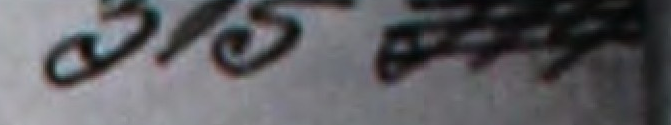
315 314
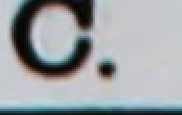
C.
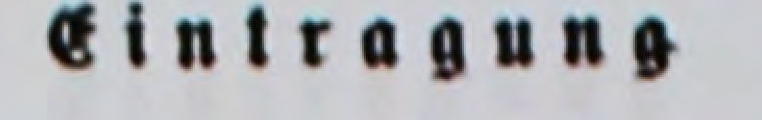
Eintragung
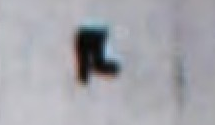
fl.
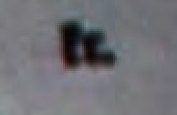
tr.
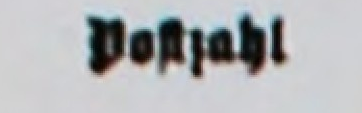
Postzahl
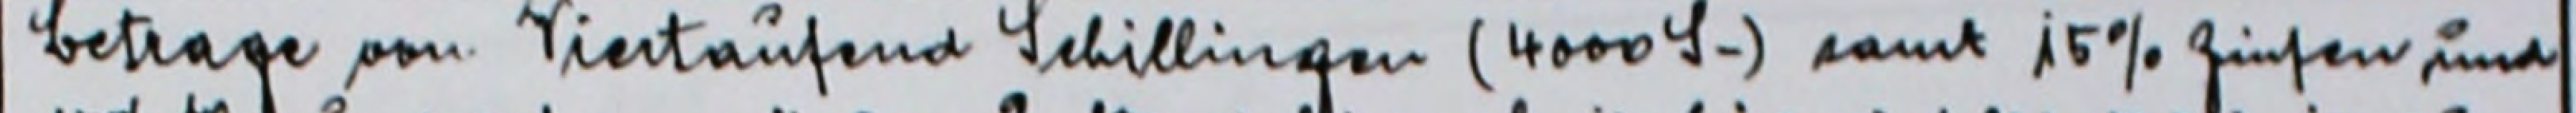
betrage von Viertausend Schillingen (4000 S-) samt 15 % Zinsen und
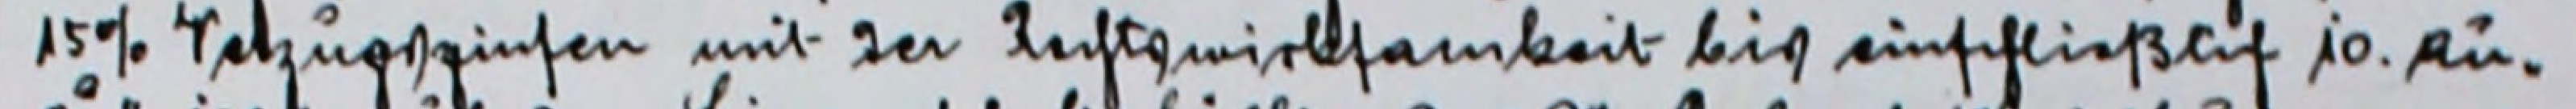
15 % Verzugszinsen mit der Rechtswirksamkeit bis einschließlich 10. Au„
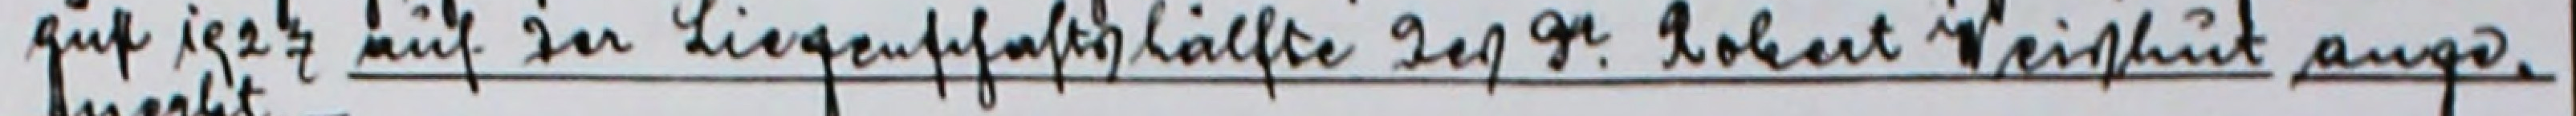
gust 1927 auf der Liegenschaftshälfte des Dr. Robert Weishut ange„
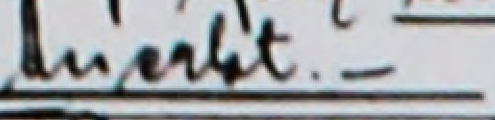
merkt.-
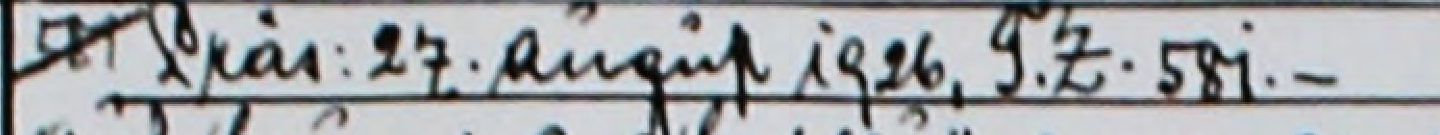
581 Präs: 27. August 1926, T.Z. 581.-
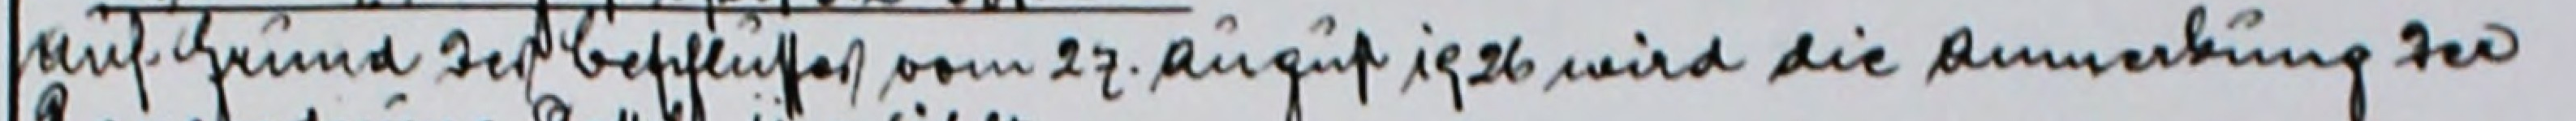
Auf Grund des Beschlusses vom 27. August 1926 wird die Anmerkung der
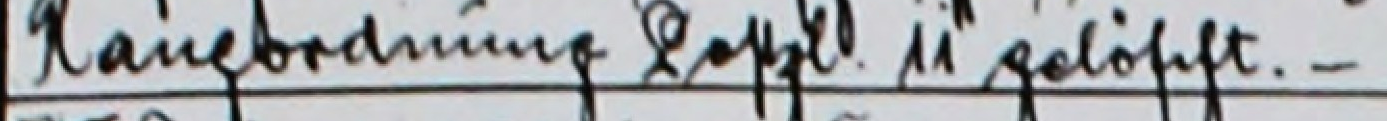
Rangordnung Postzl. 11 gelöscht.-
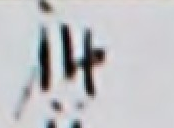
14
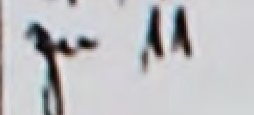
zu 11
